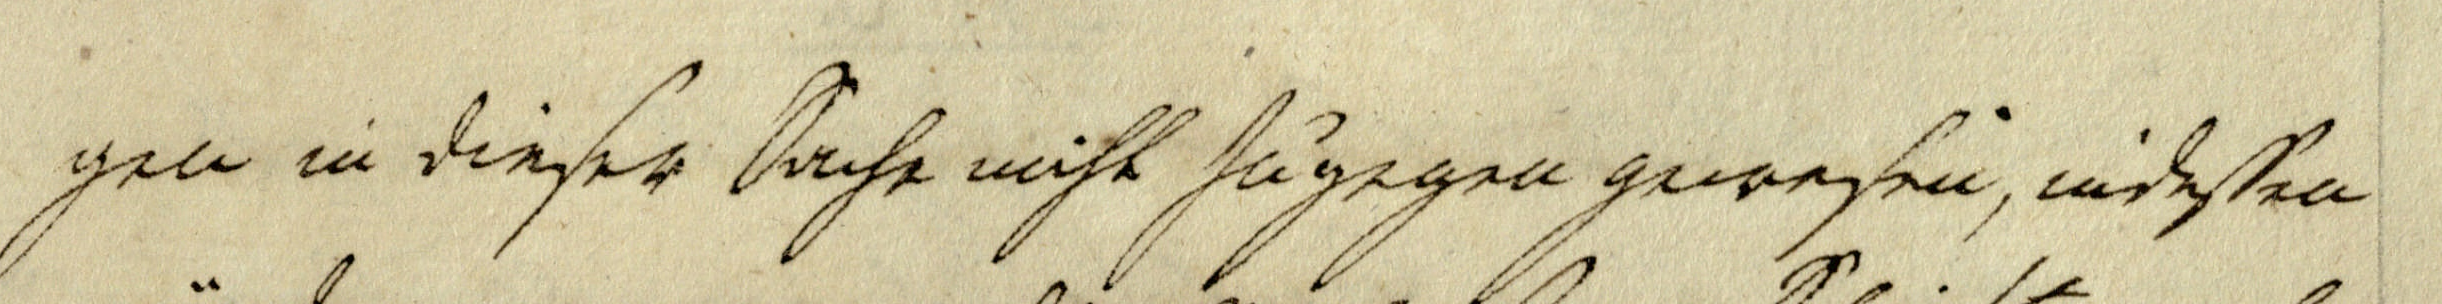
gen in dieser Sache nicht zugegen gewesen, indessen
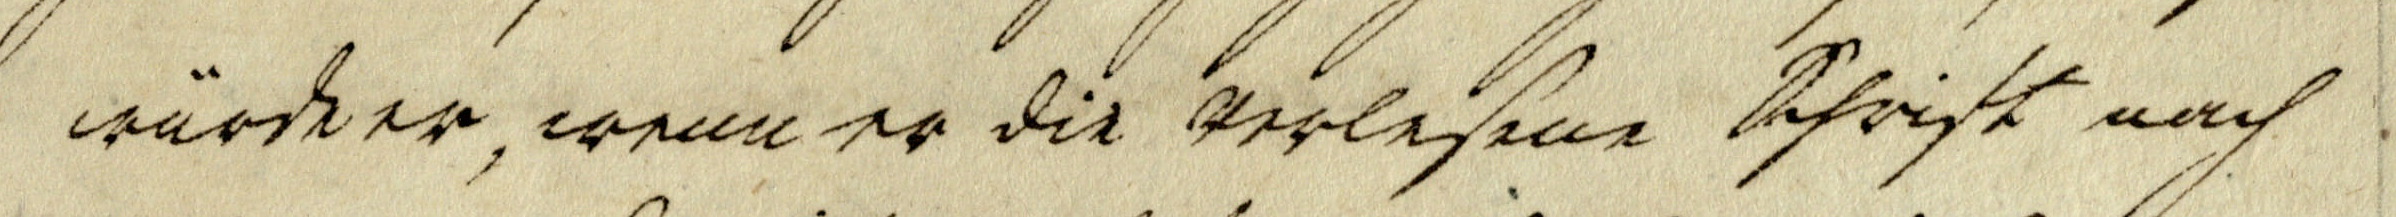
würde er, wenn er die verlesene Schrift nach
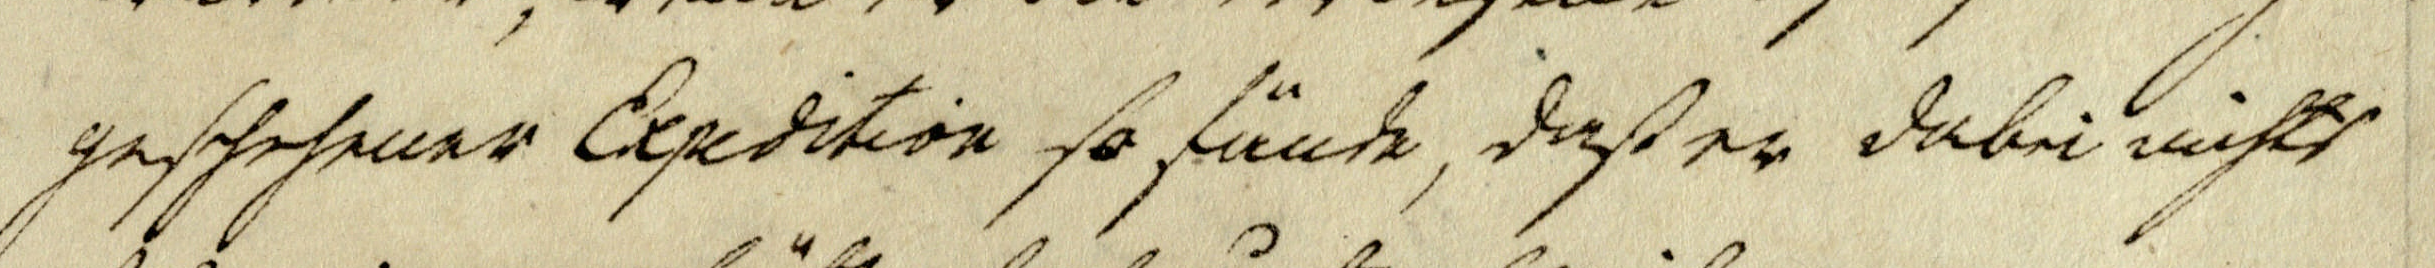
geschehener Expedition so fände, daß er dabei nichts
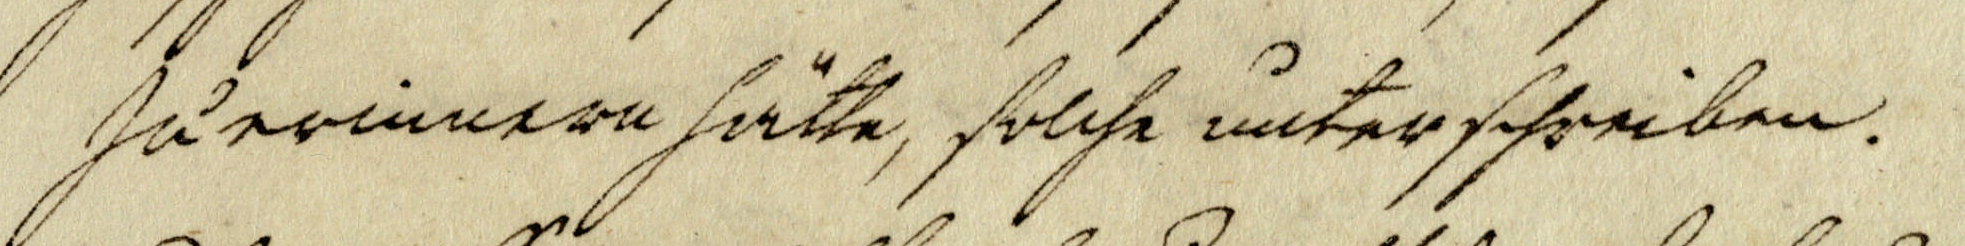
zu erinnern hätte, solche unterschreiben.
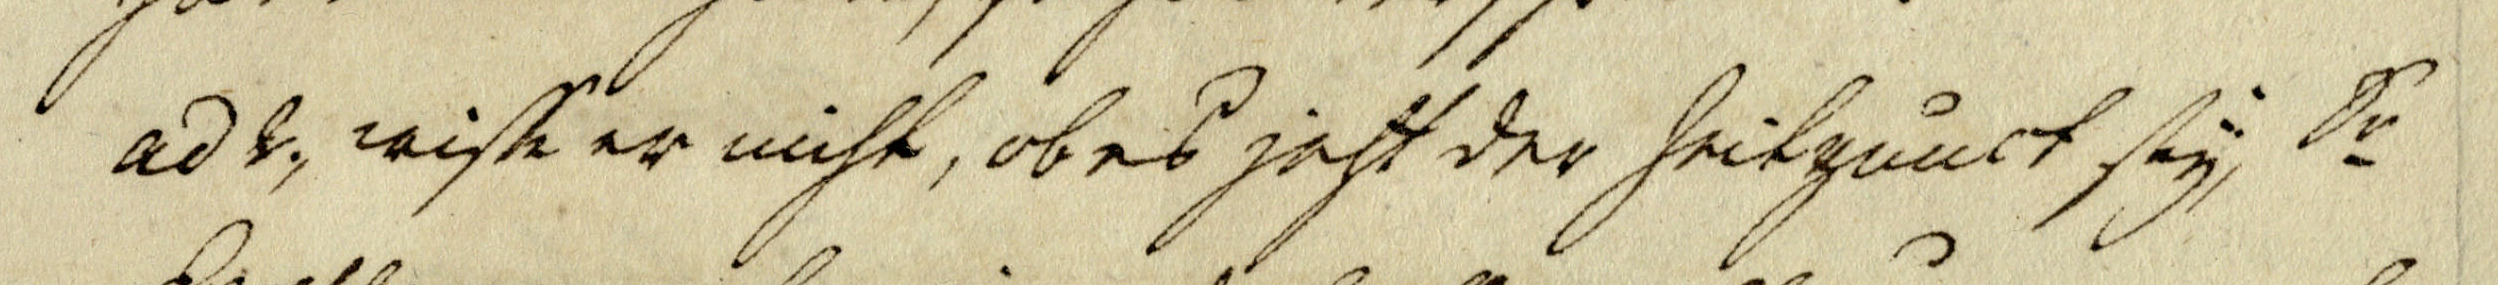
ad 2, wisse nicht, ob es jetzt der Zeitpunct seÿ, Sr.
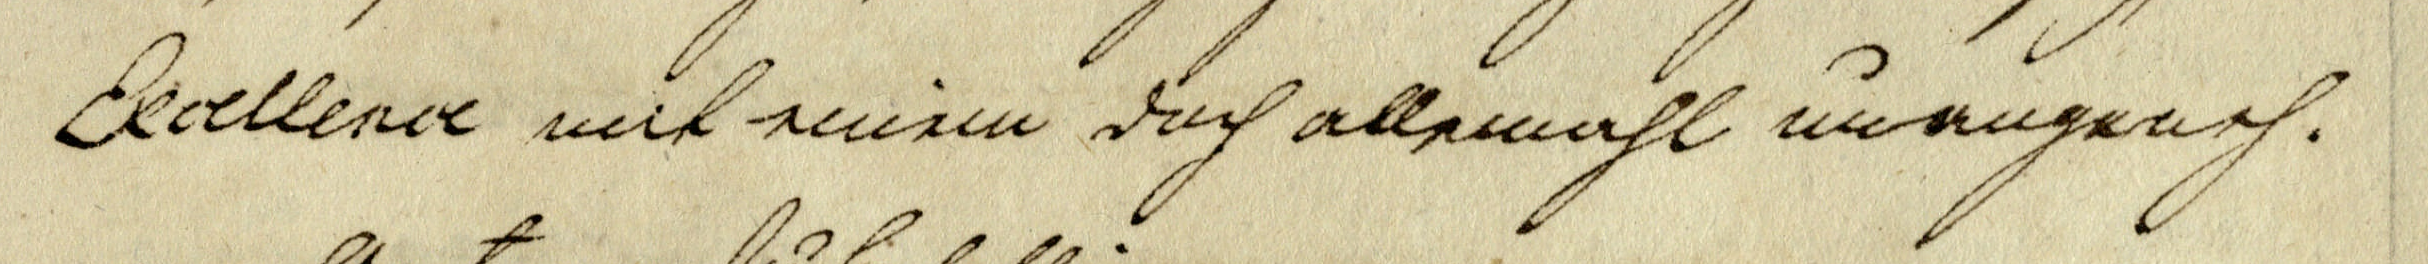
Excellence mit einem doch allemahl unangeneh¬
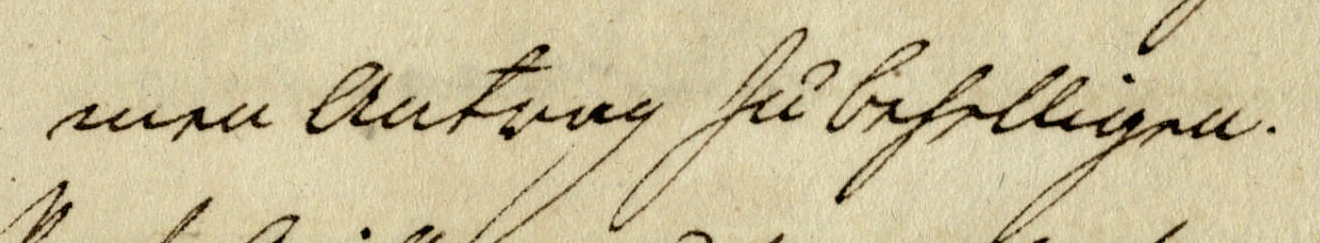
men Antrag zu behelligen.
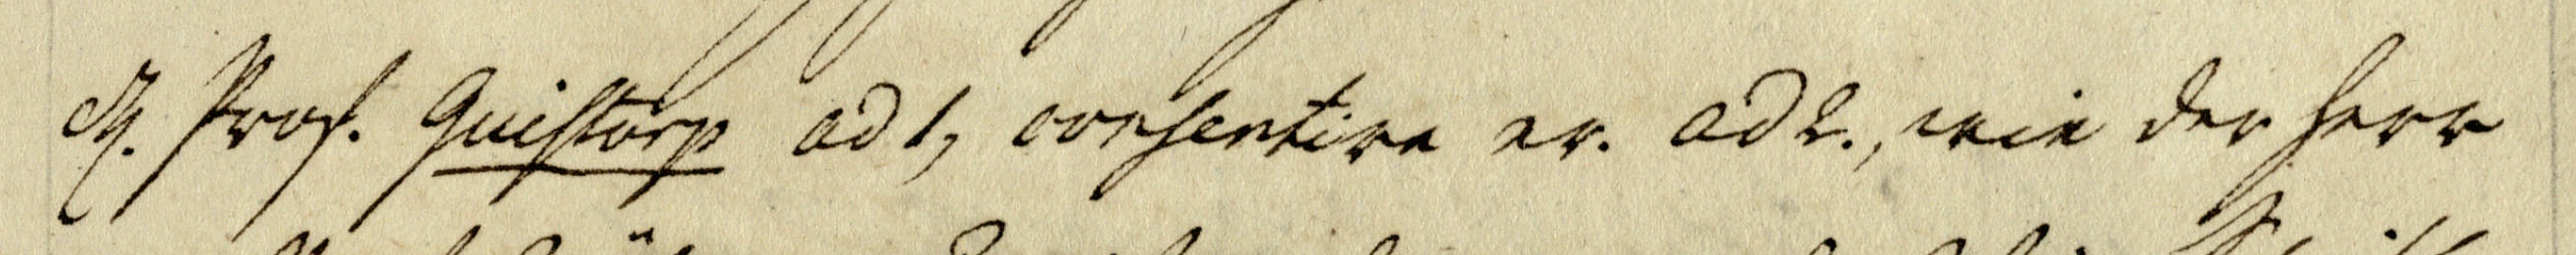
dh. Prof. Quistorp ad 1., consentire er. ad 2., wie der Herr
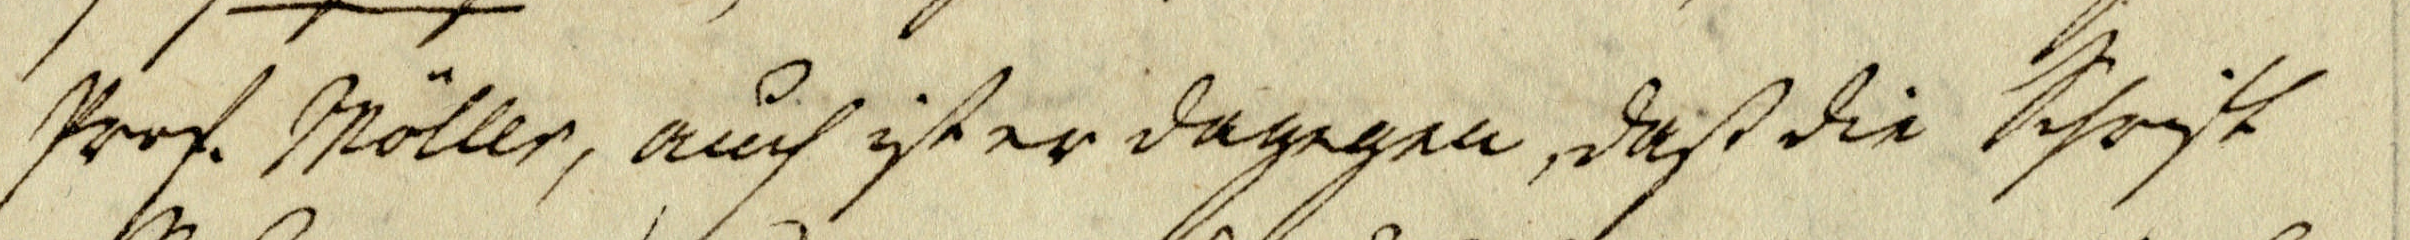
Prof. Möller, auch ist er dagegen, daß die Schrift
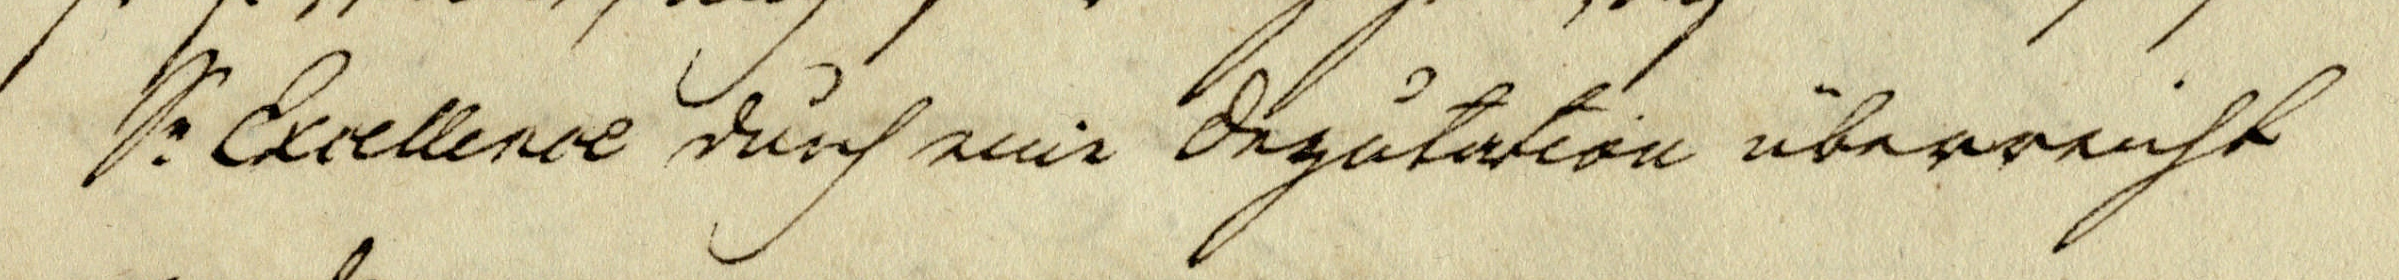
Sr Excellence durch eine Deputation überreicht
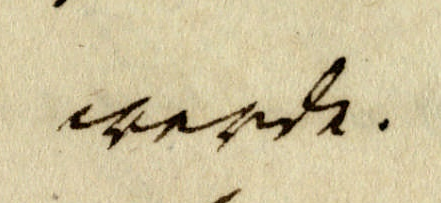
werde.
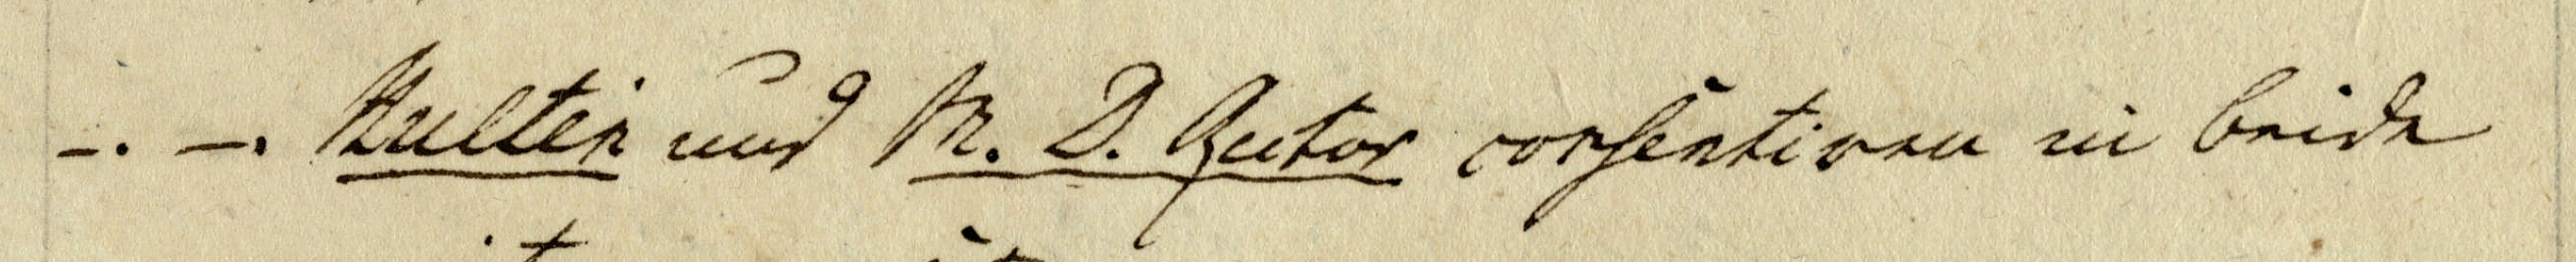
Hultén und M. D. Rector consentiren in beide
